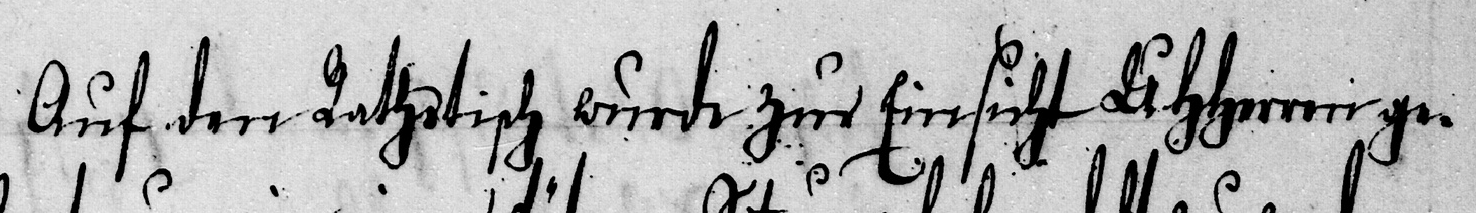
Auf den Rathstisch wurde zur Einsicht UHHerren ge¬
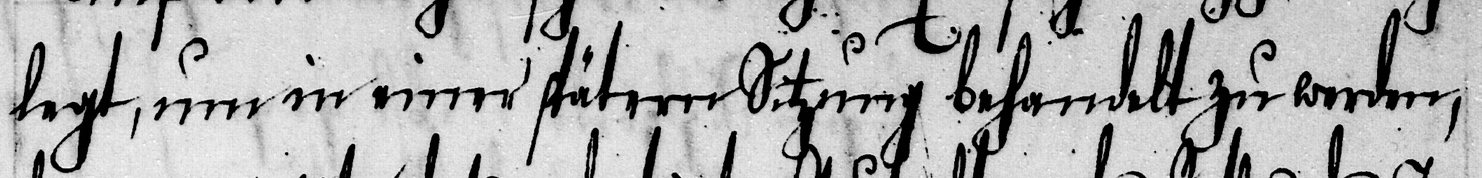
legt, um in einer spätern Sitzung behandelt zu werden,
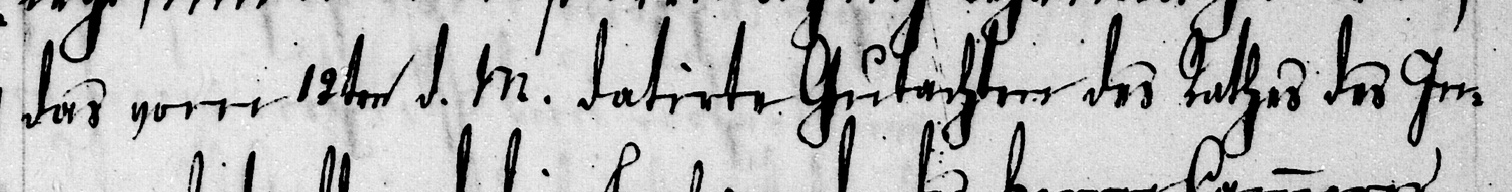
das vom 12ten d. M. datirte Gutachten des Rathes des In¬
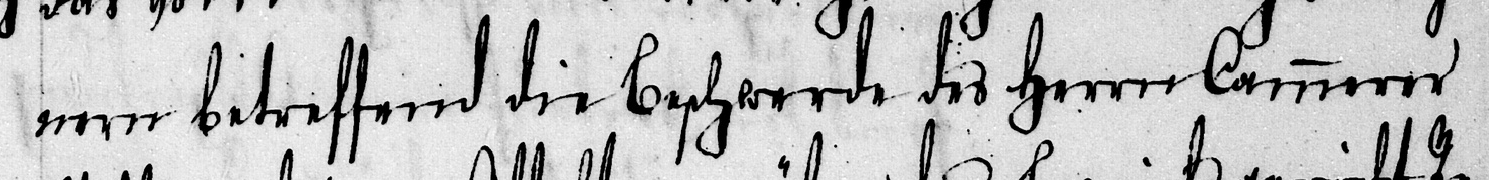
nern betreffend die Beschwerde des Herrn Cammerer
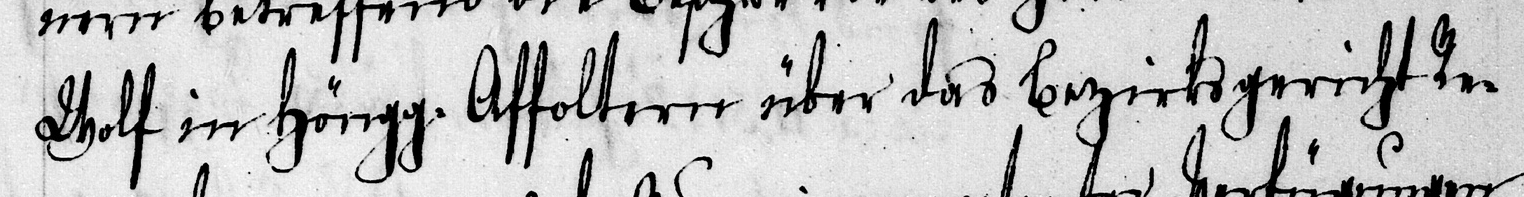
Wolf in Höngg-Affoltern über das Bezirksgericht Re¬
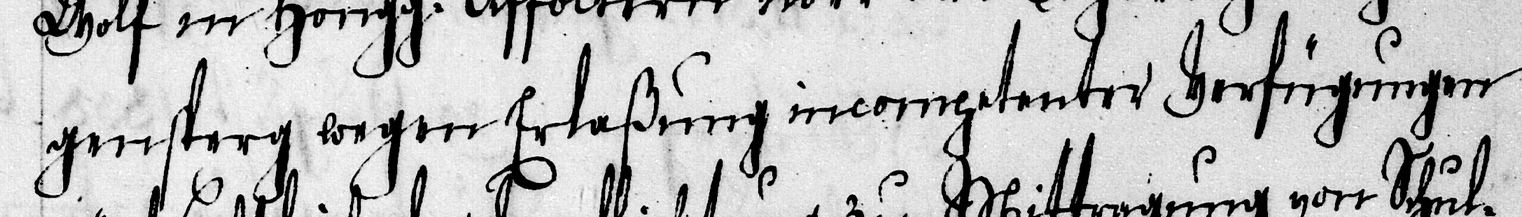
gensperg wegen Erlaßung incompetenter Verfügungen
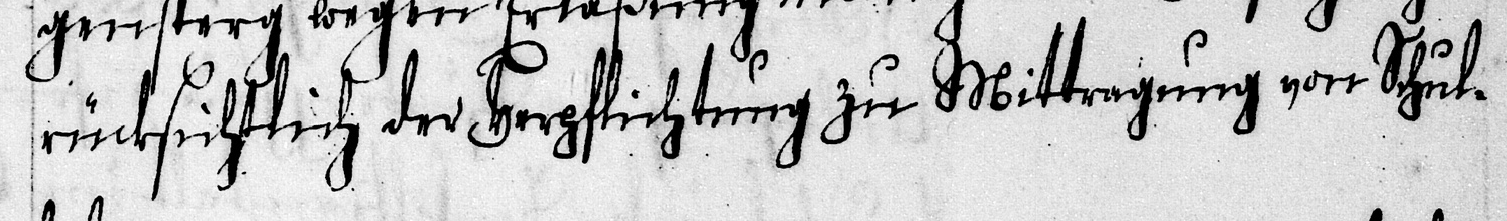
rücksichtlich der Verpflichtung zu Mittragung von Schul¬
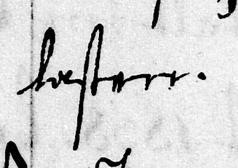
lasten.
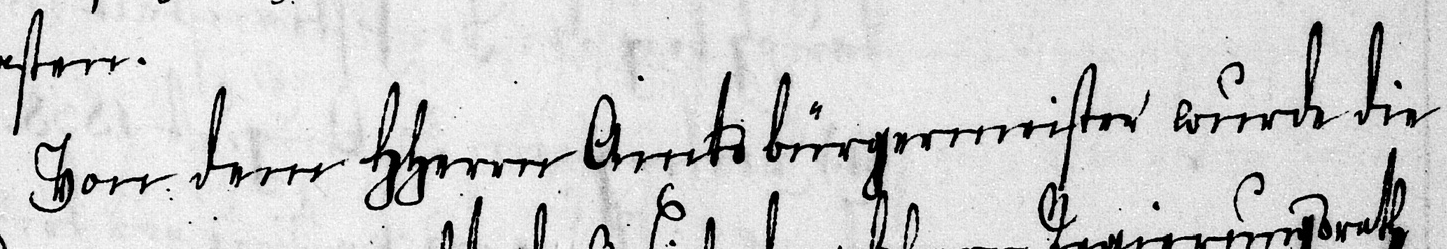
Von dem HHerrn Amtsbürgermeister wurde die
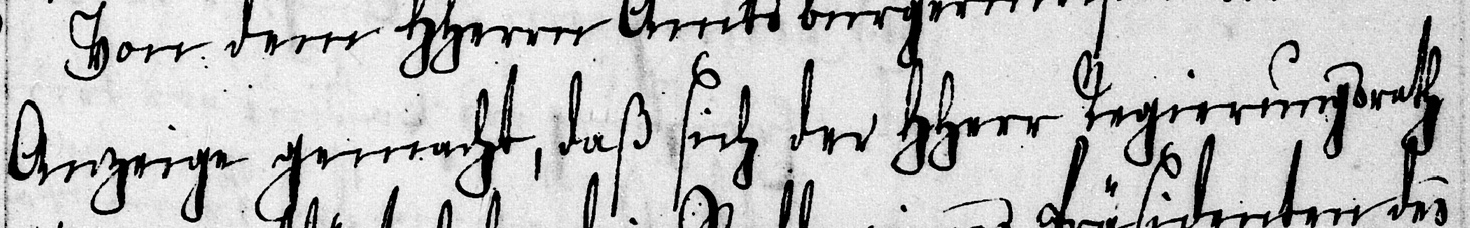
Anzeige gemacht, daß sich der HHerr Regierungsrath
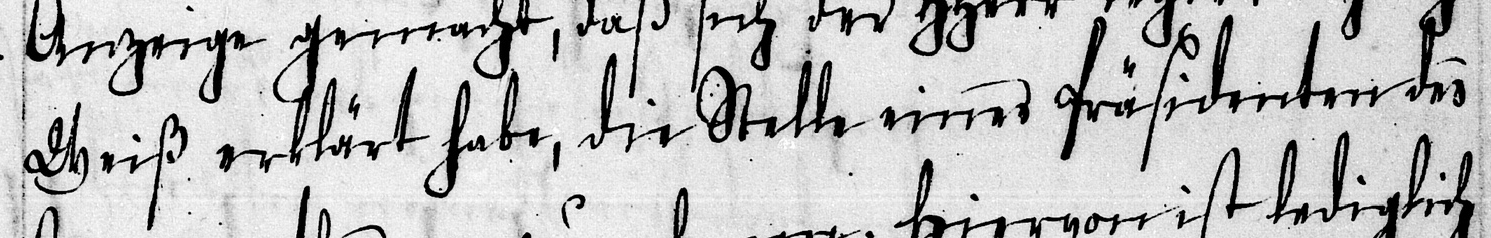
Weiß erklärt habe, die Stelle eines Präsidenten des
